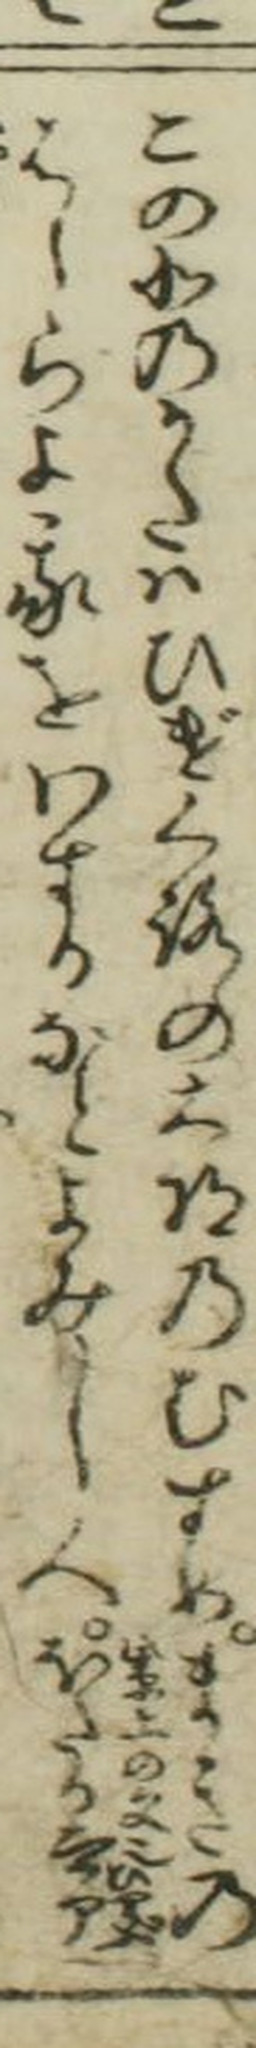はしらよ我をわするなとよみし人。ほたる兵部
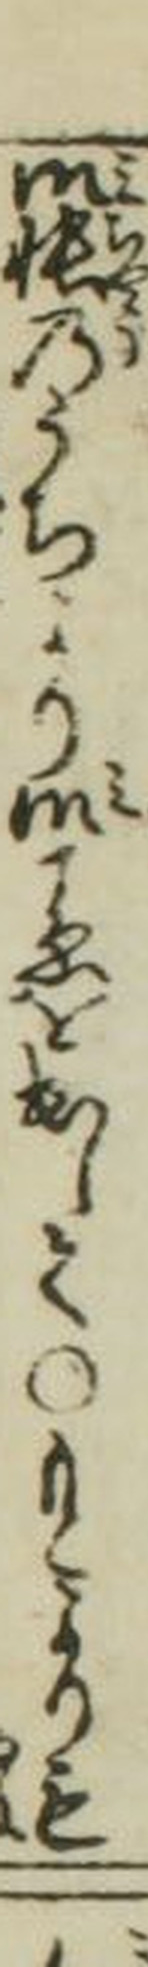御帳のうちより御こゑを出して○もとよりも
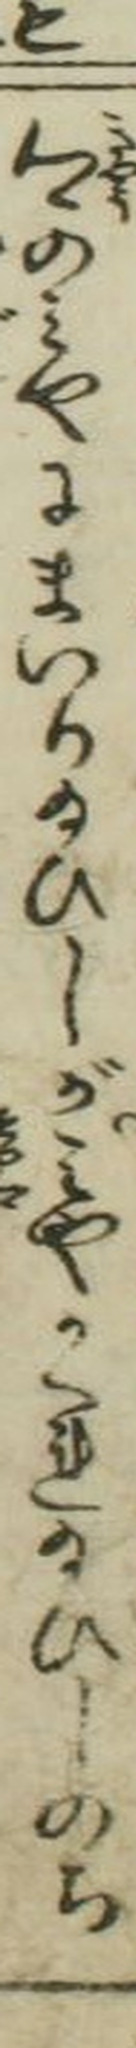卿のみやにまいり給ひしが。みやかくれ給ひしのち
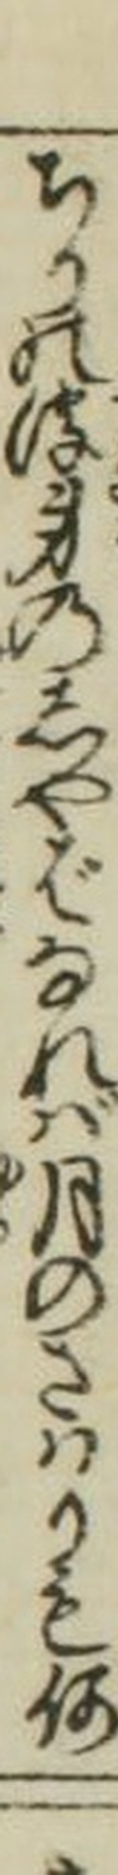ちりの浮身のしやばなれば月のさはりも何
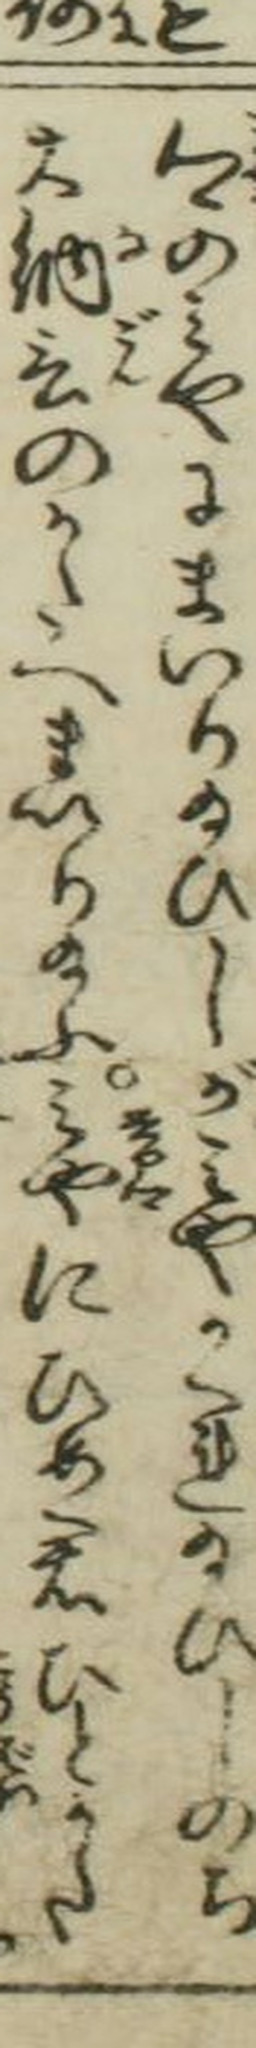大納言のかたへまいり給ふ。みやにひめ君ひとかた
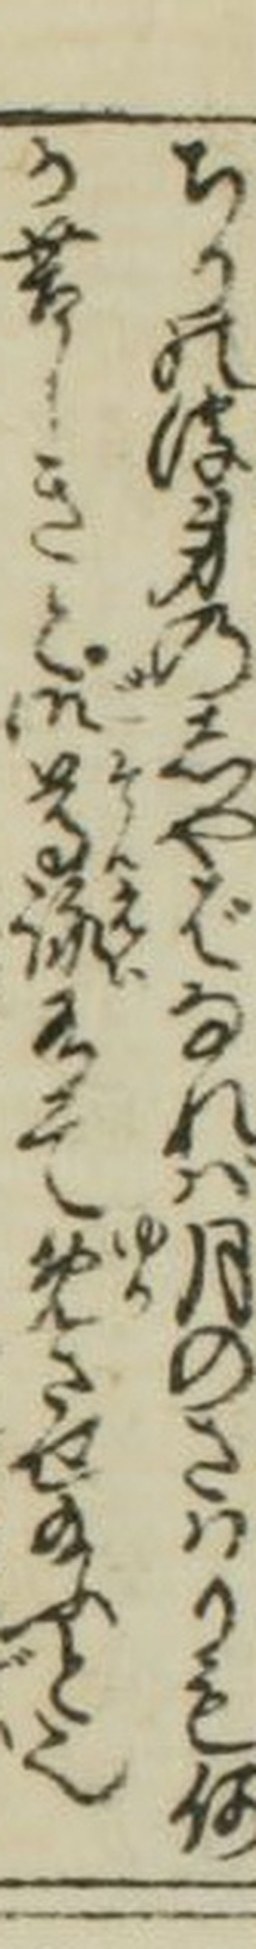か苦しきと。御尊詠有て免させ給ふと也
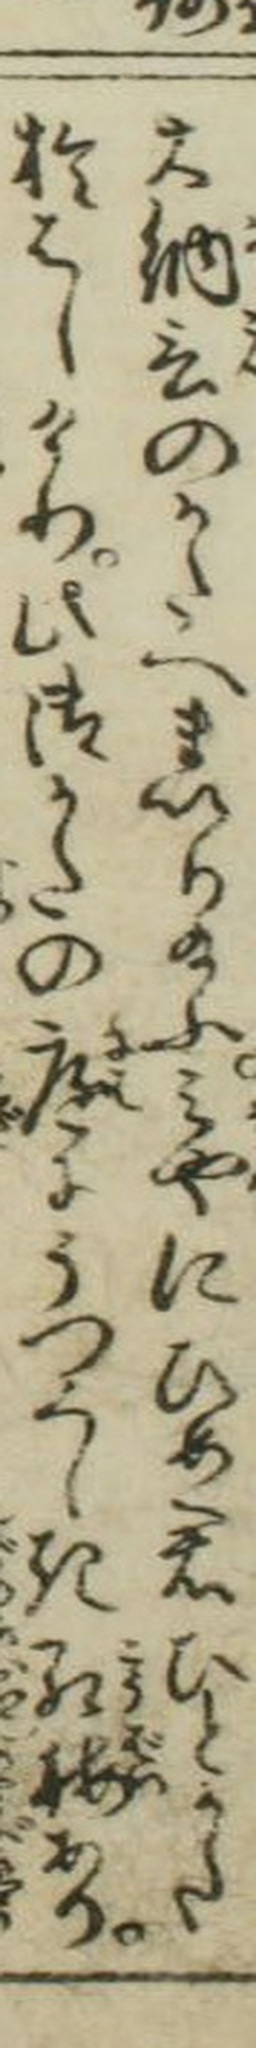おはしけり。此御かたの庭にうつくしき紅梅あり。
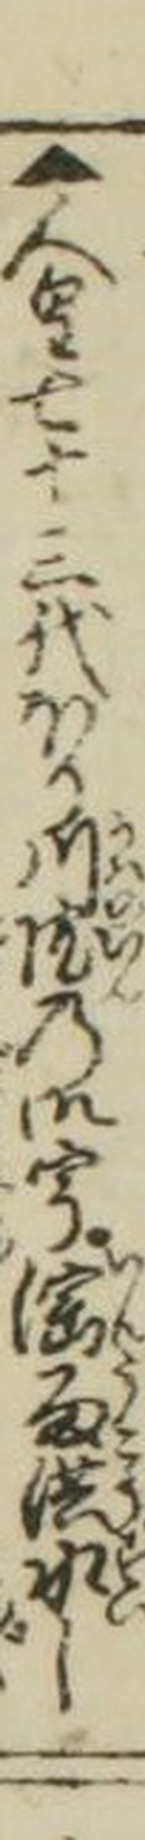▲人皇七十三代ほり川院の御宇。淫雨洪水し
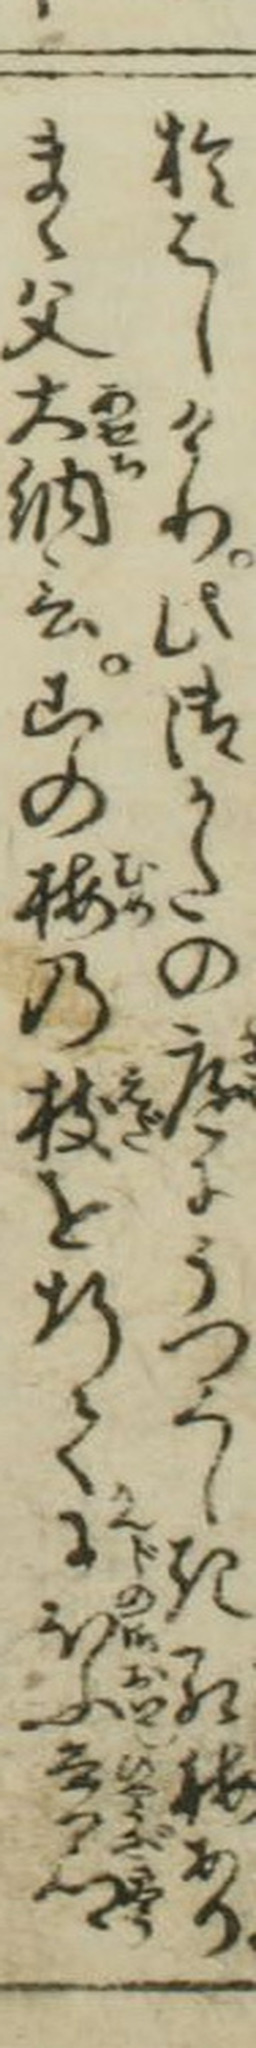まゝ父大納言。この梅の枝を折てにほふ兵部卿
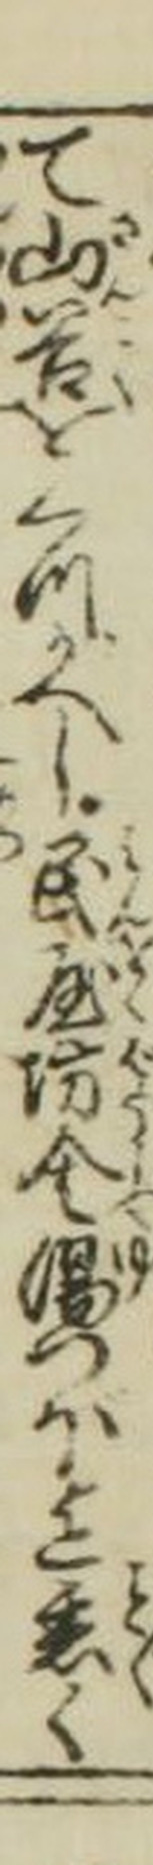て山谷をくつかへし。民屋坊舎湯つぼ迄悉く
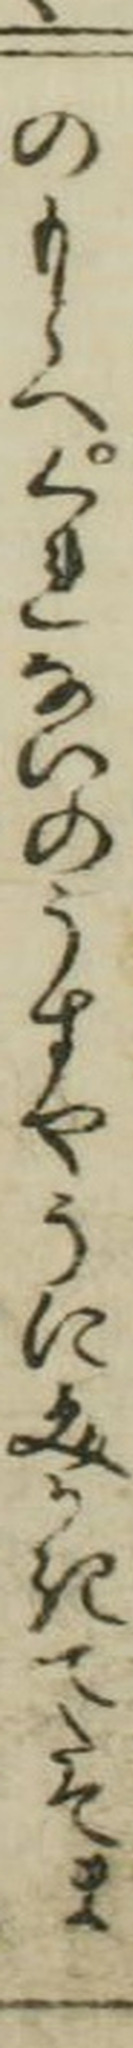のもとへ。くれないのうすやうに文かきてたてま
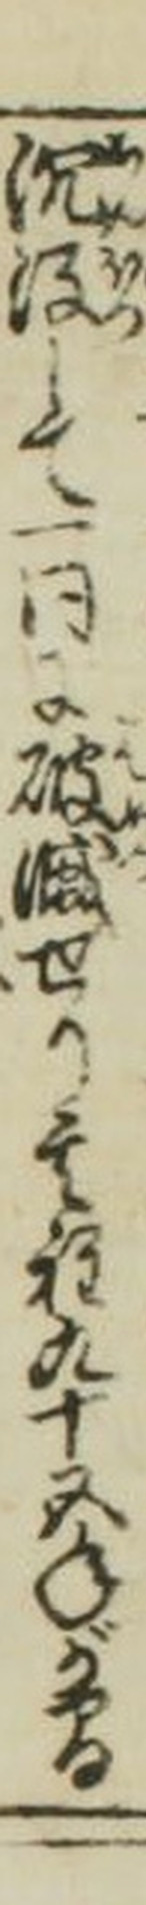沉没して一同に破滅せり其程九十五年が間
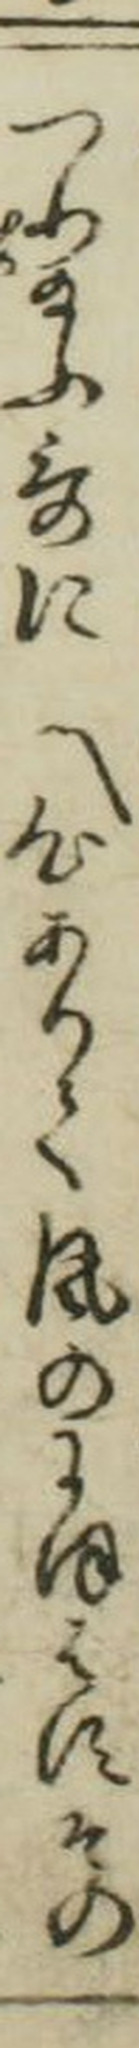つり給ふ歌に〽心ありて風のにほはすその
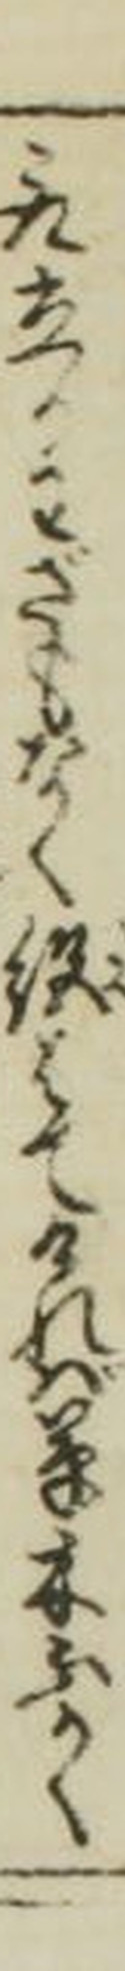取立るわざもなく絕はてければ草木ふかく
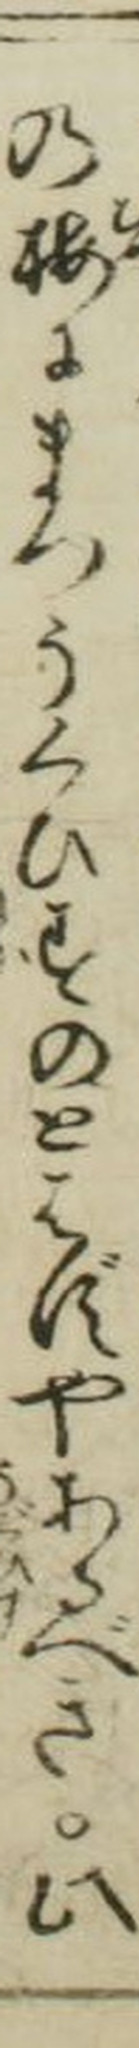の梅にまつうくひすのとはずやあるべき。此
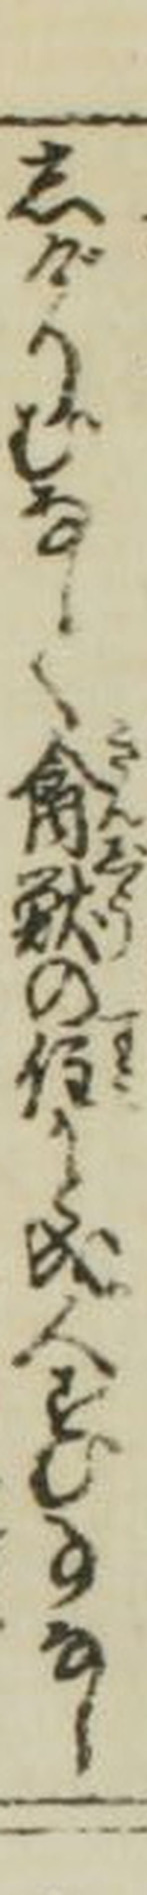しげりむなしく禽獣の住かと成。人すむ事なし
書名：女源氏教訓鑑
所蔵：東京学芸大学附属図書館
